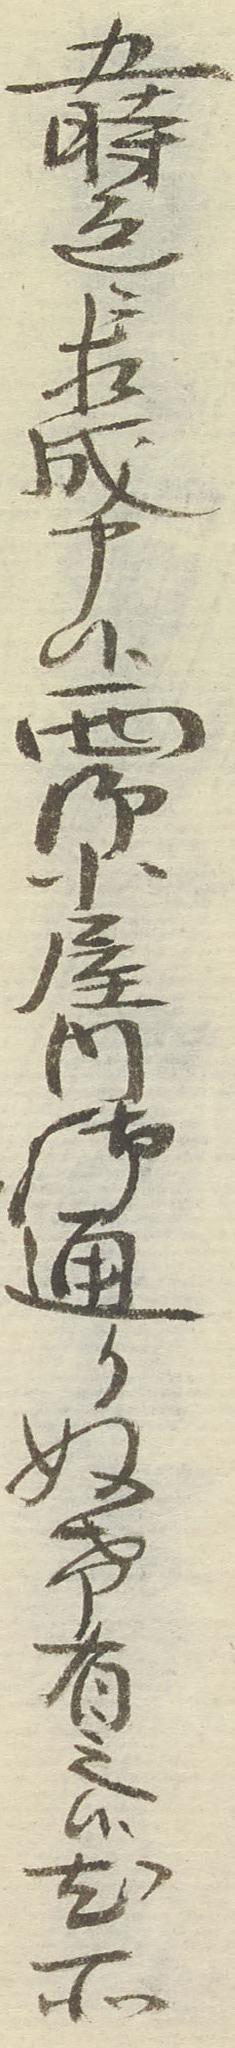五時迄ニ相成申候西御小屋内御通りぬけ有之候尤所
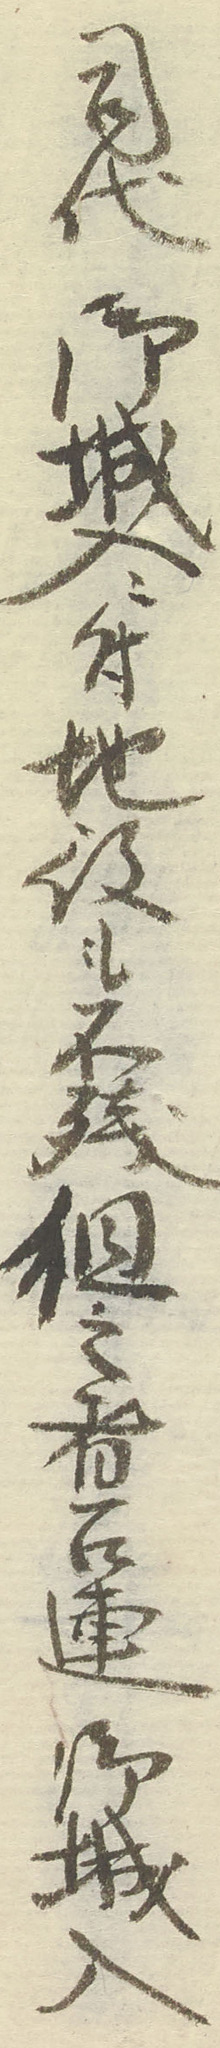司代御城入ニ付地役も不残組之者召連御城入
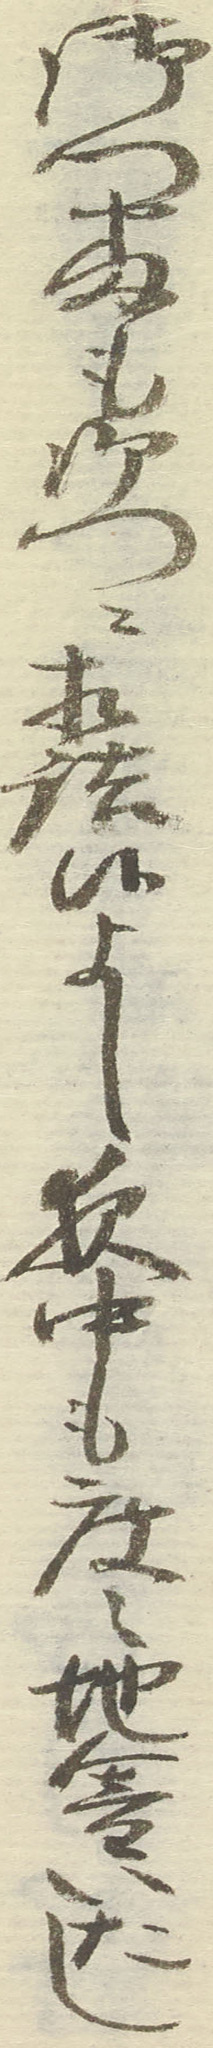御門番も御門ニ相詰候よし夜中も度〻地響いたし
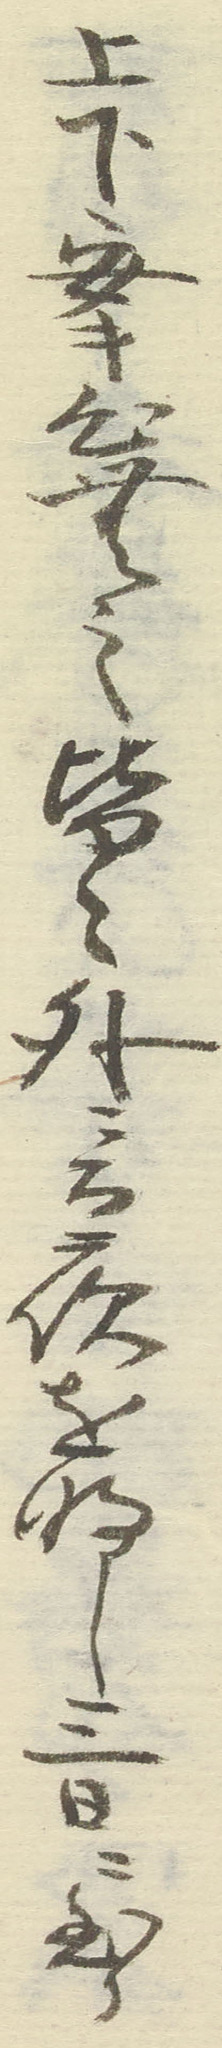上下安キ心無之皆〻外ニ而夜を明し三日ニ至り
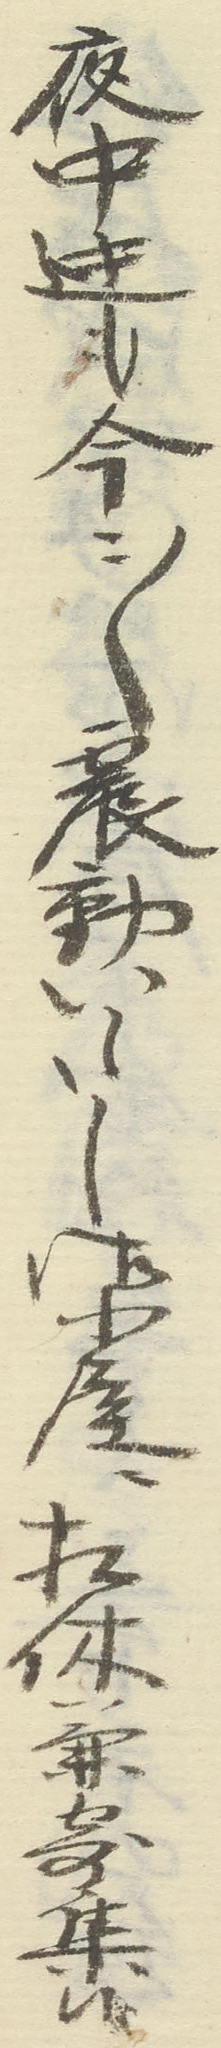夜中迚も今ニ〳〵震動いたし御小屋ニ相休兼寄集候
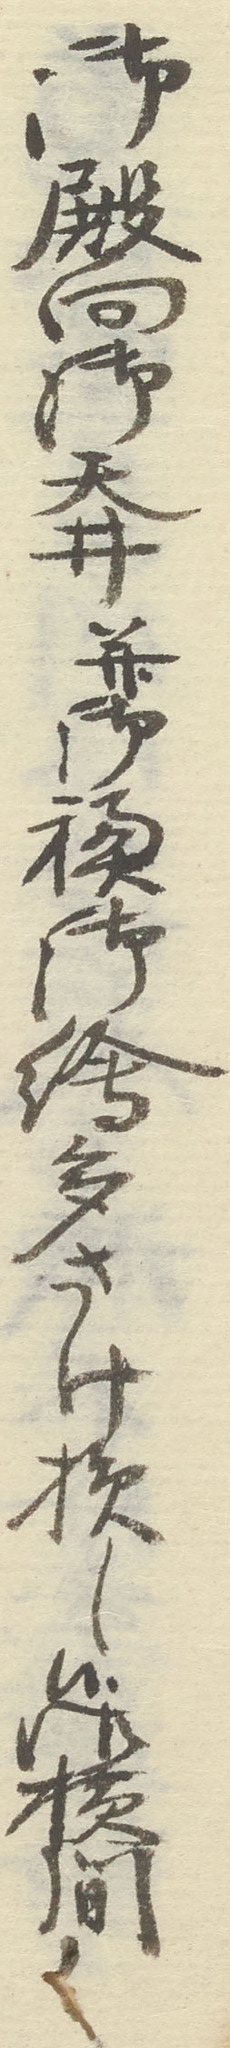御殿向御天井并御襖御繪多さけ損し候御横間之
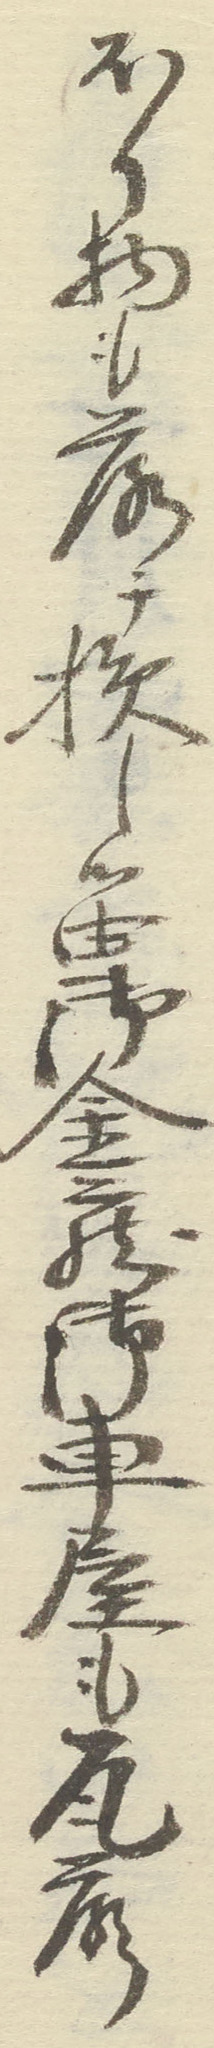ほり物も落テ損し候由御金蔵御車屋も瓦落
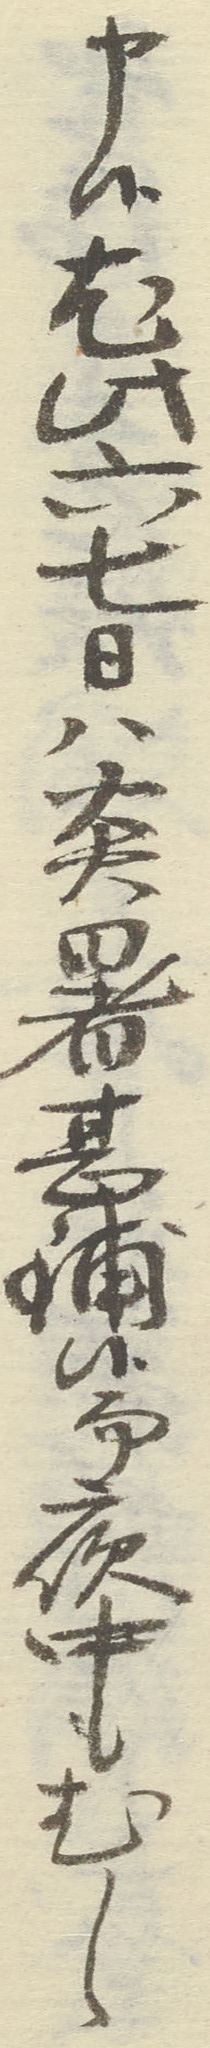申候尤此六七日ハ炎暑甚鋪候而夜中もむし
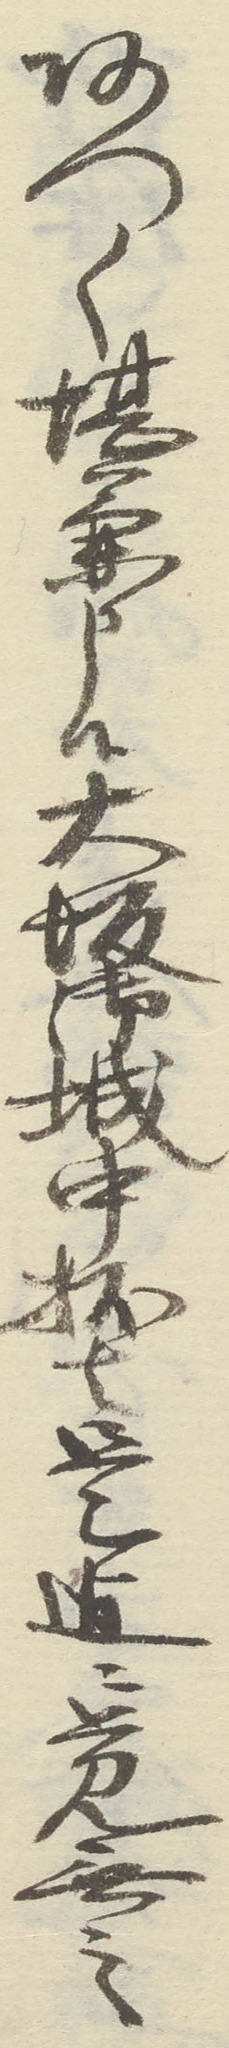あつく堪兼申候大坂御城中抔は是迄ニ覚無之
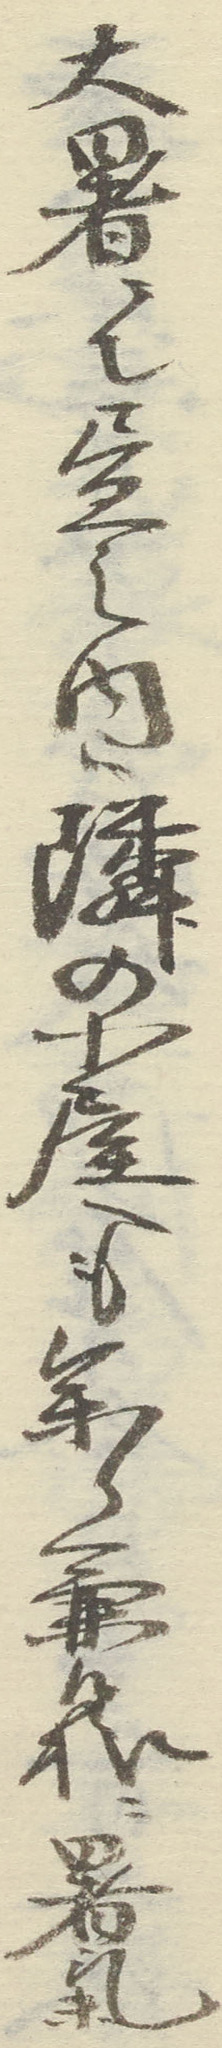大暑ニて昼之内ハ隣の小屋へも参り兼候様ニ暑氣
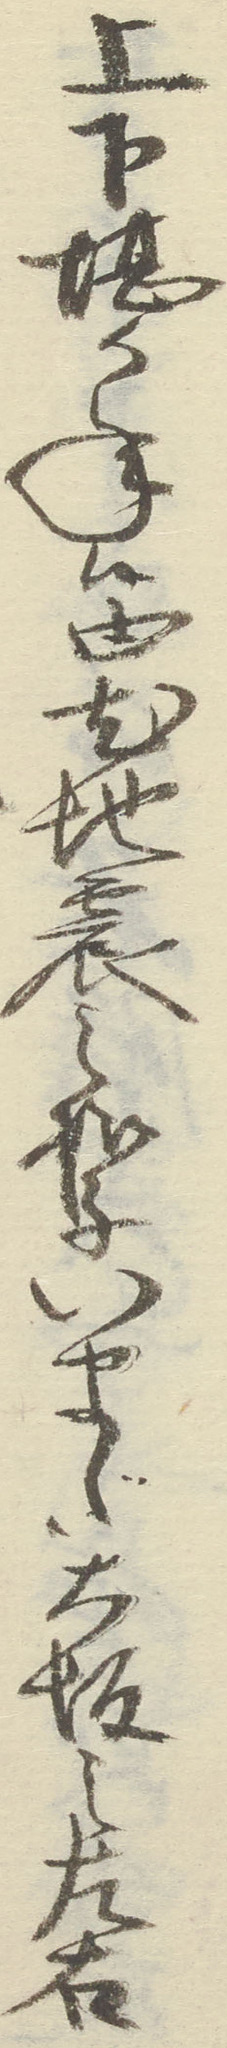上下堪かね候由尤地震之様子いまだ大坂之左右
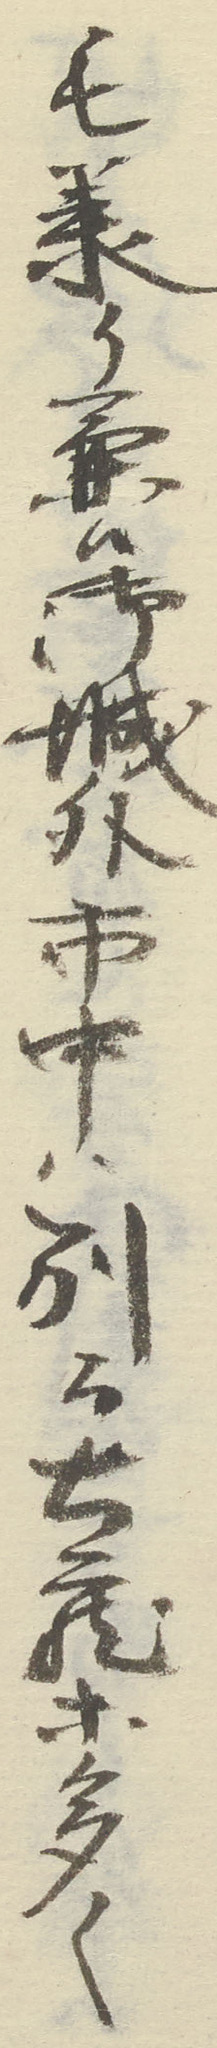も承り兼候御城外市中ハ別而土蔵抔多く
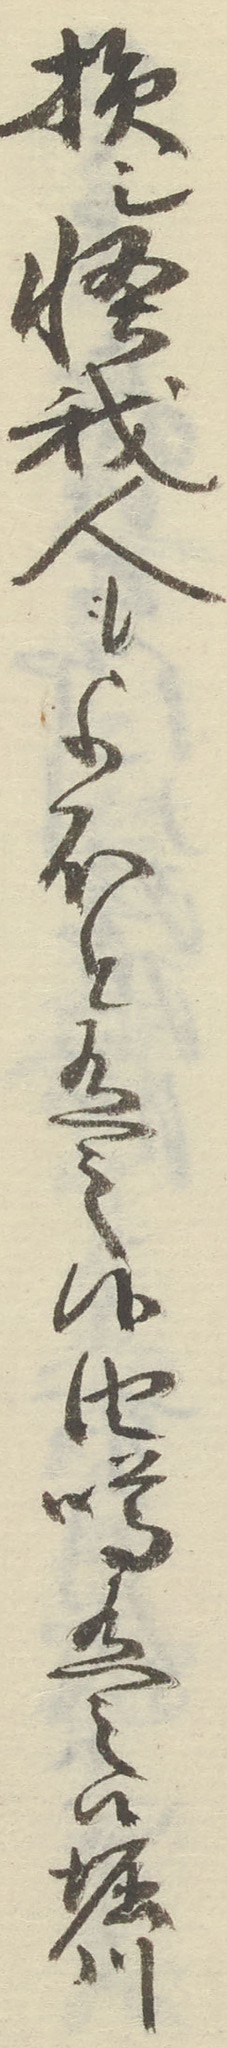損シ怪我人もよほと有之候由噂有之候堀川
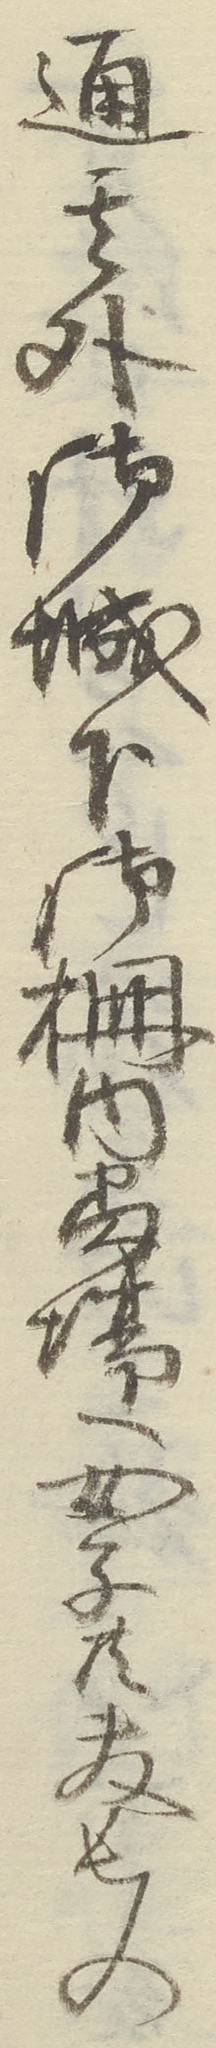通其外御城下御柵内番場へ女子共敷もの

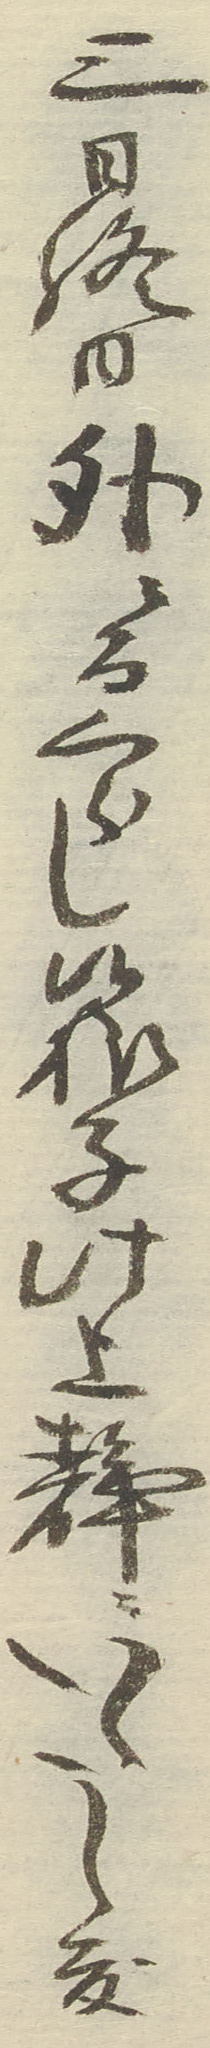三日終日外ニ而くらし候様子此上静ニいたし度
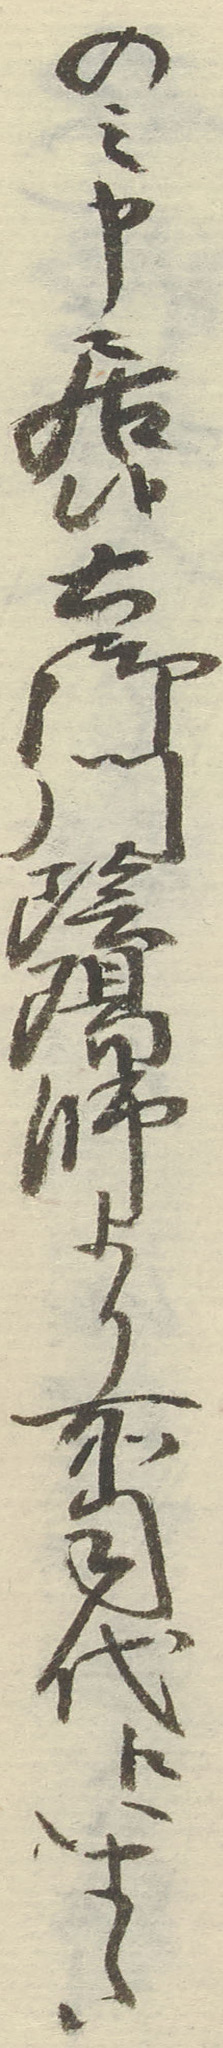のミ申居候土御門陰陽師より所司代江いまた
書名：[七月二日京都大地震に付御番衆大木市左衛門より申し越し候書面畧書状写]
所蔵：東京大学総合図書館 General Library in the University of Tokyo, JAPAN
